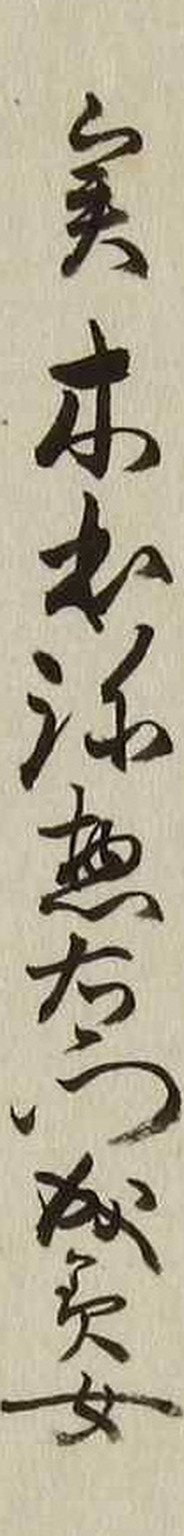実木本弥惣右エ門成美女
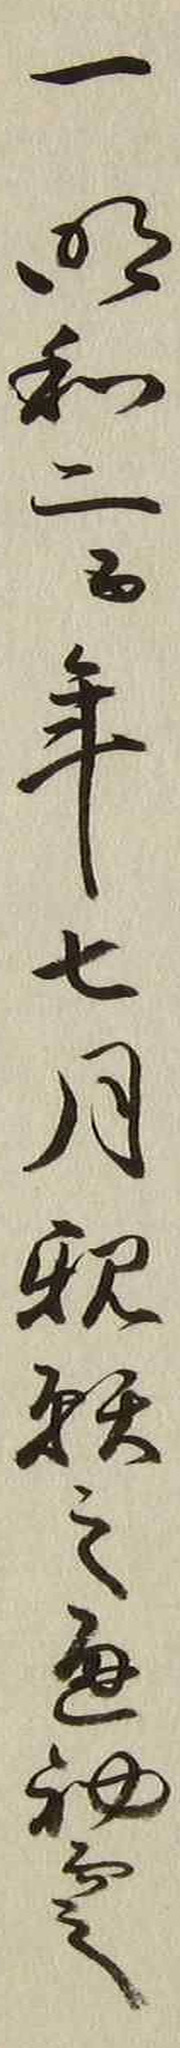一明和二酉年七月親願之通初而之
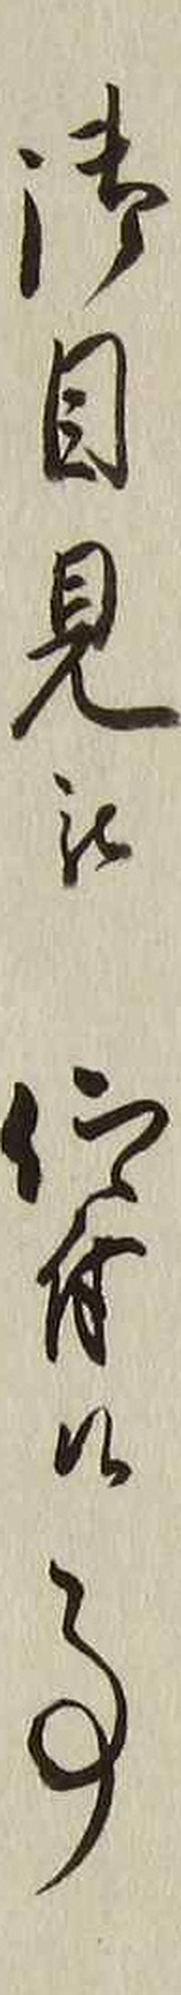御目見被仰付候事
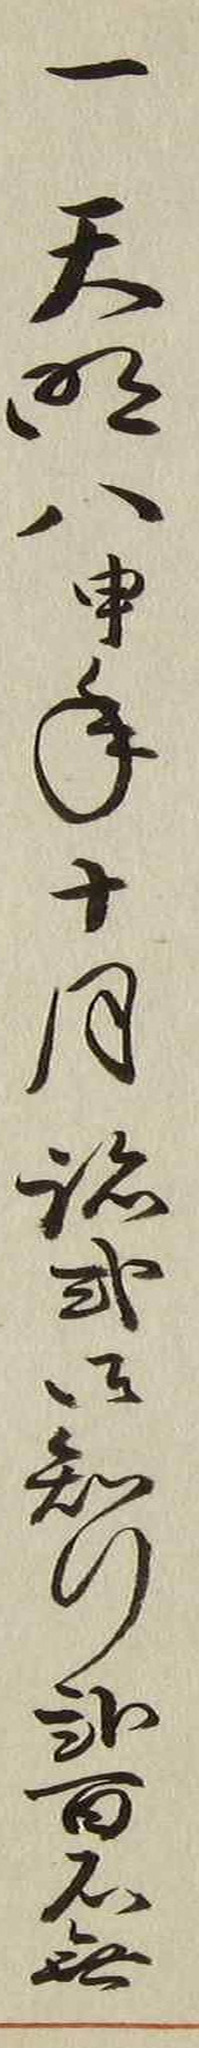一天明八申年十月跡式御知行弐百石無
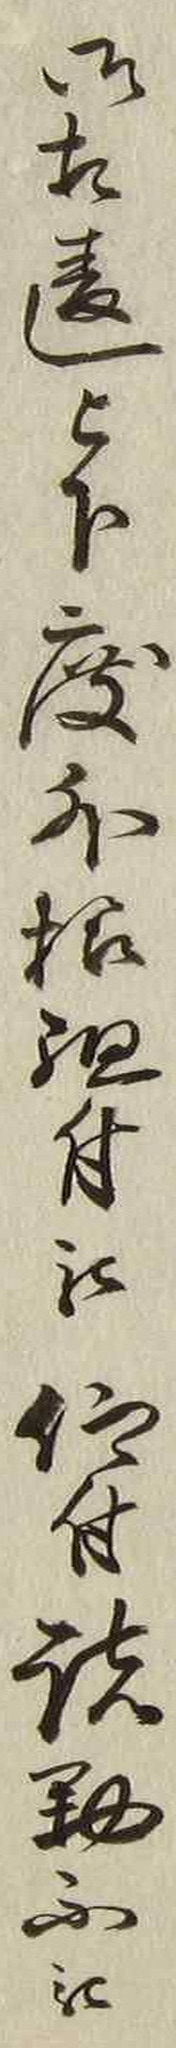御相違被下度外様組付被仰付諸勤不被
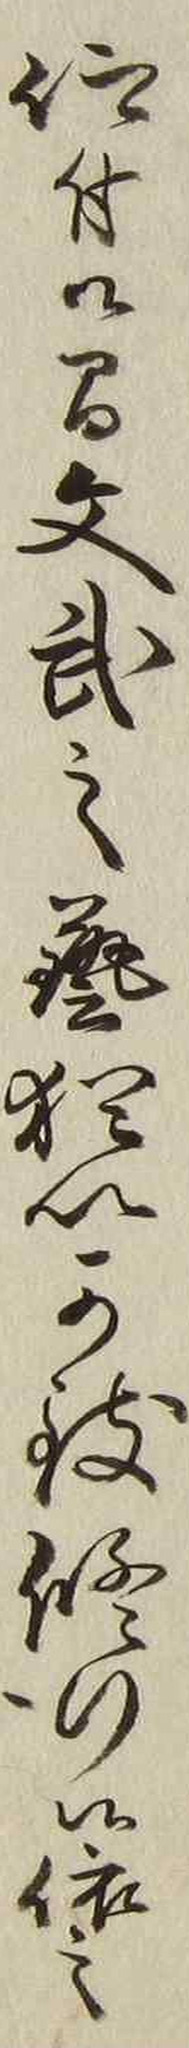仰付候間文武之芸猶以可致修行候依之
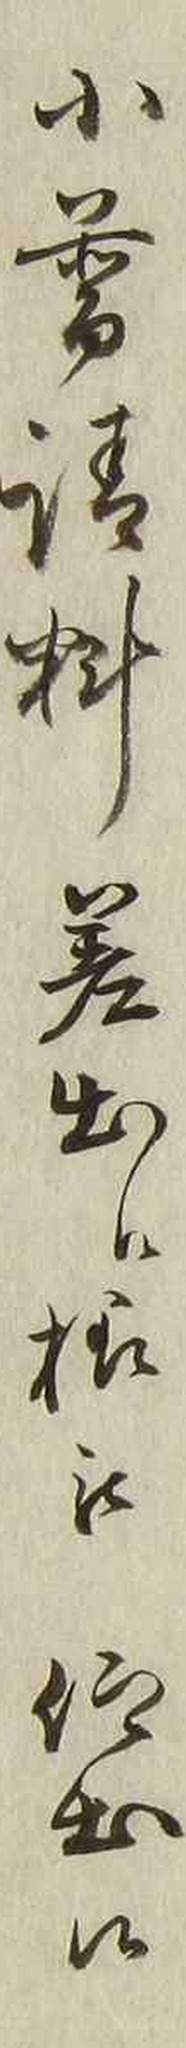小普請料差出候様被仰出候

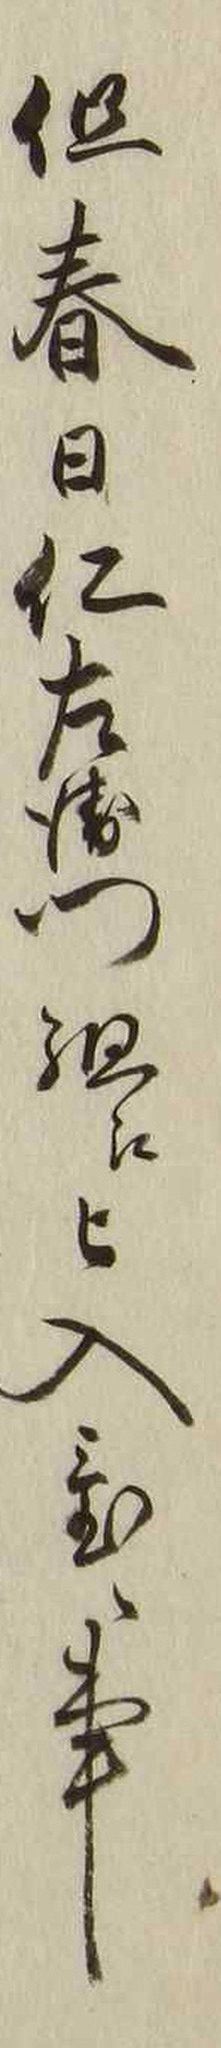但春日仁左衛門組江被入置候事
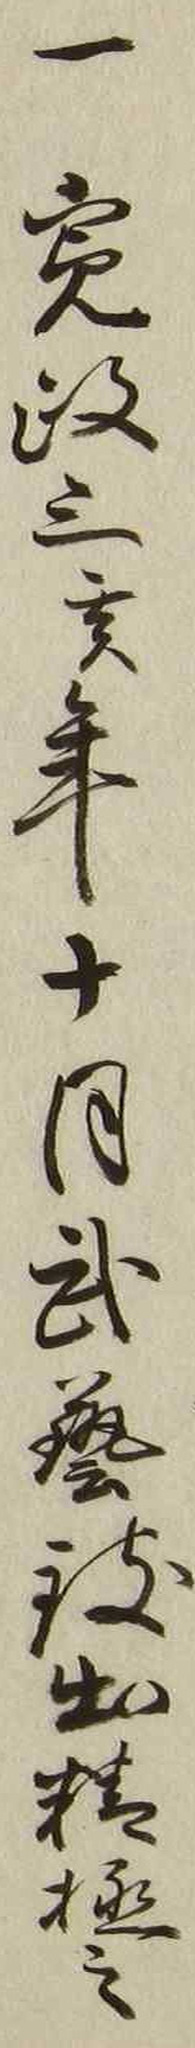一寛政三亥年十月武芸致出精極之
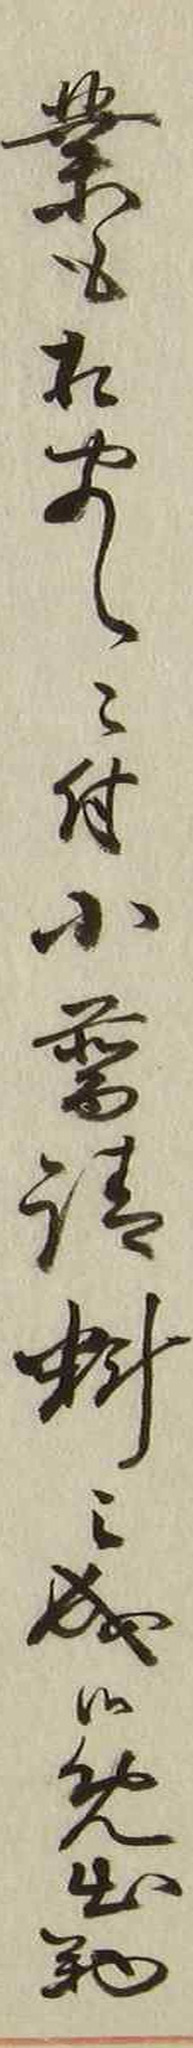業も相聞候ニ付小普請料被成御免出勤
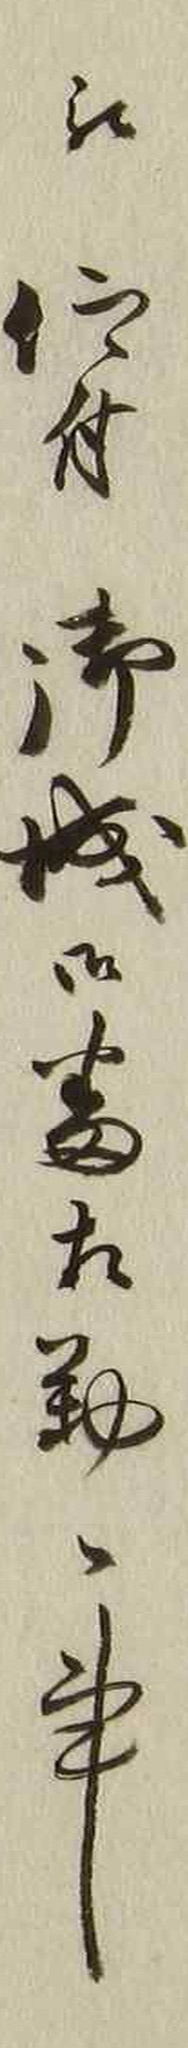被仰付御城御番相勤候事
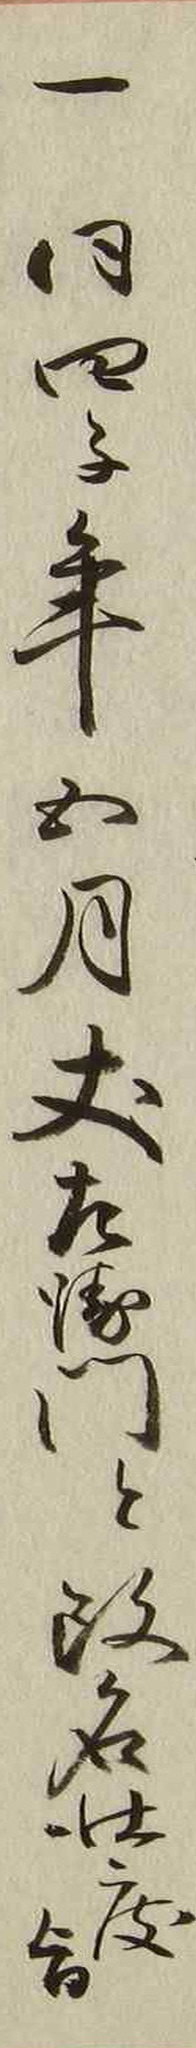一同四子年五月丈左衛門と改名仕度旨
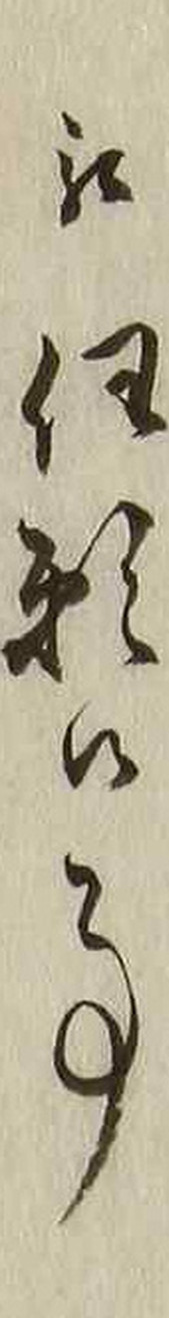被任願候事
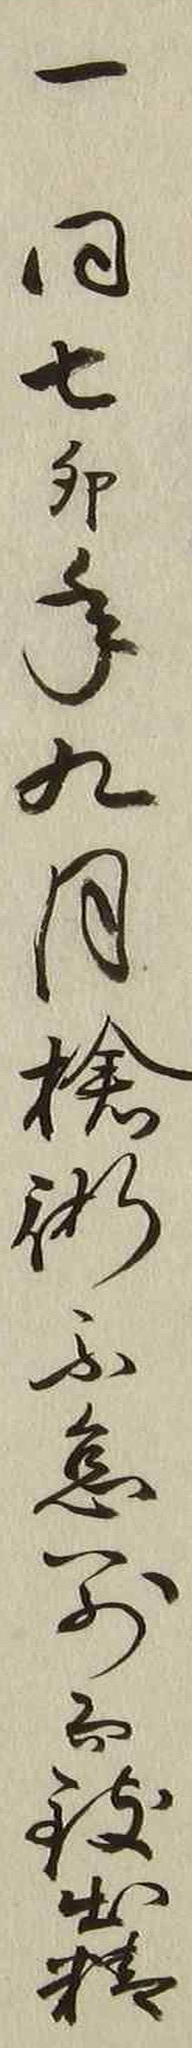一同七卯年九月槍術不怠別而致出精
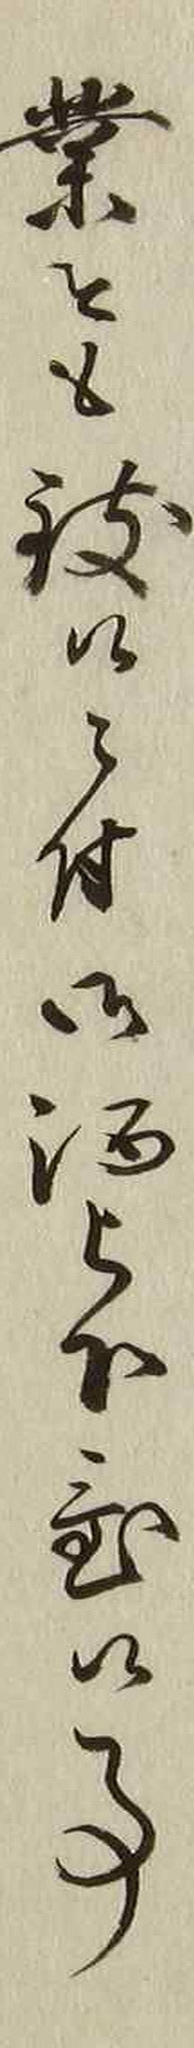業をも致候ニ付御酒被下置候事
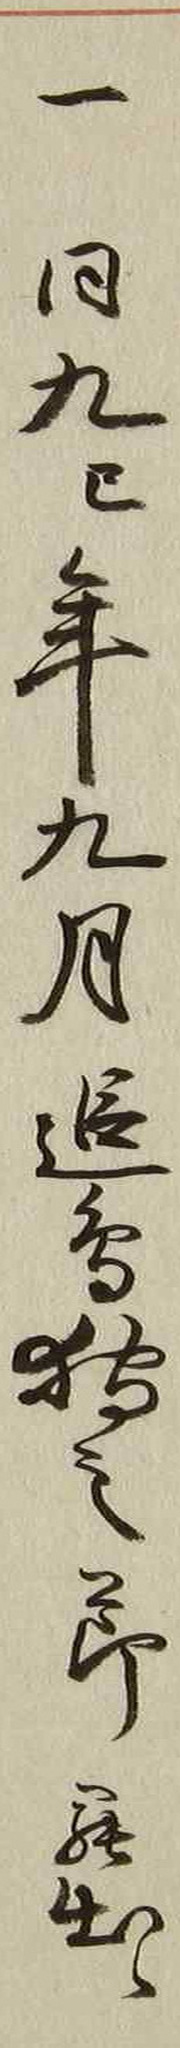一同九巳年九月追鳥狩之郎罷出候
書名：諸士系譜　巻之15　い之部15
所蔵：会津若松市立会津図書館
